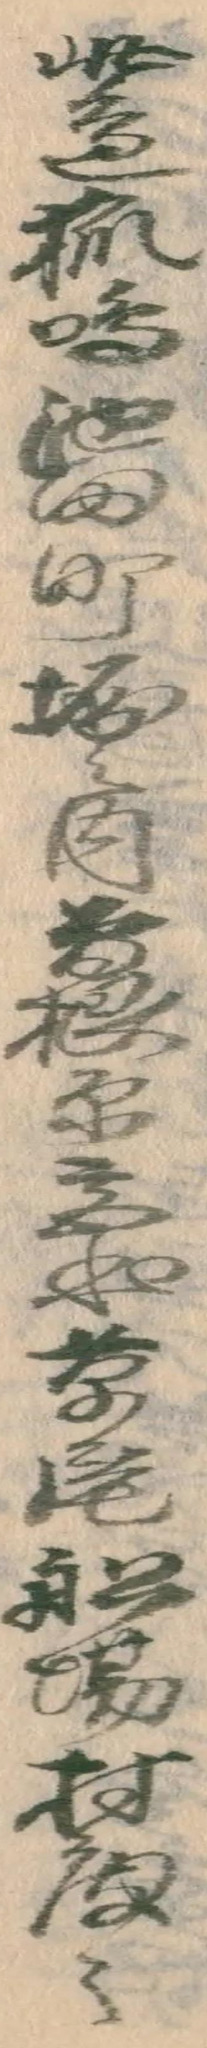此辺狐鳴池田町堀之内曽根原宮本草尾船場村度々
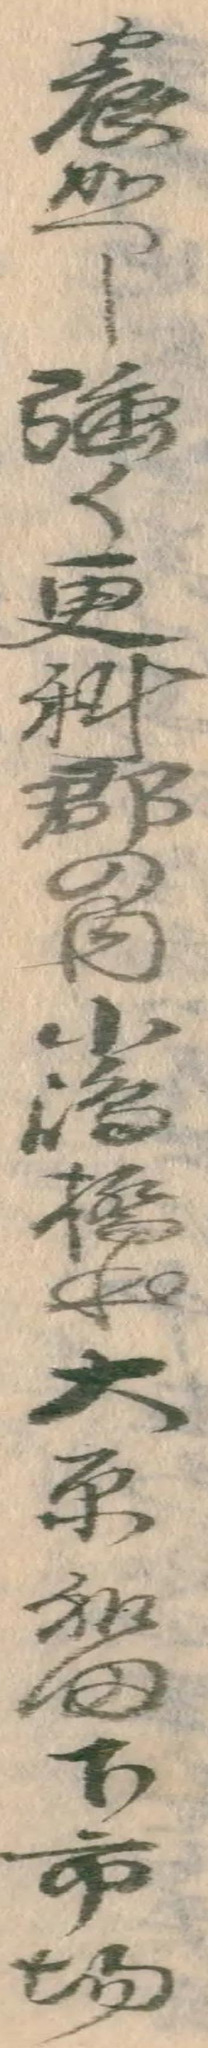震かへし強く更科郡の内小嶋橋本大原和田下市場
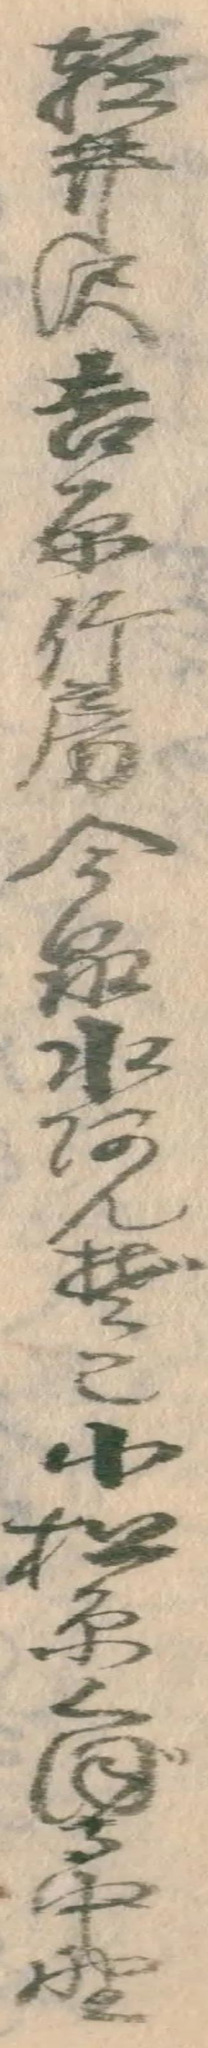軽井沢吉原竹房今泉水あんばこ小松原く同寺中野
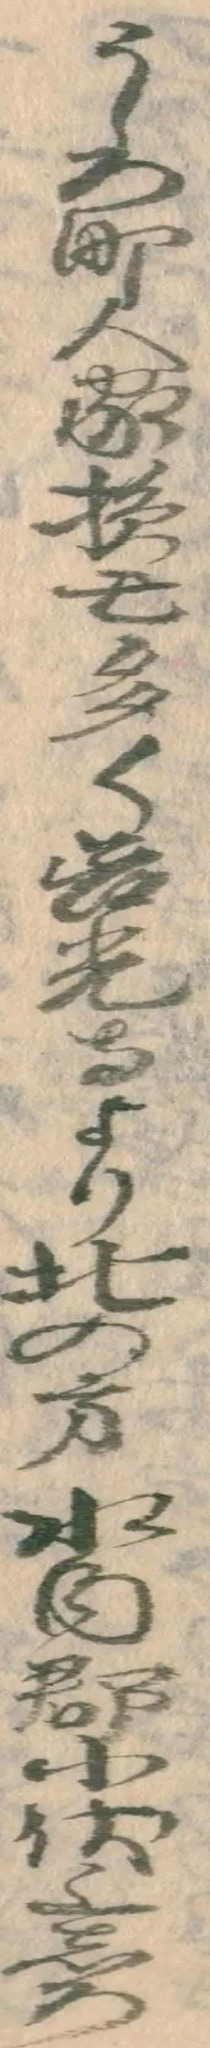うろ町人家損亡多く善光寺より北の方水内郡小伏上しろ
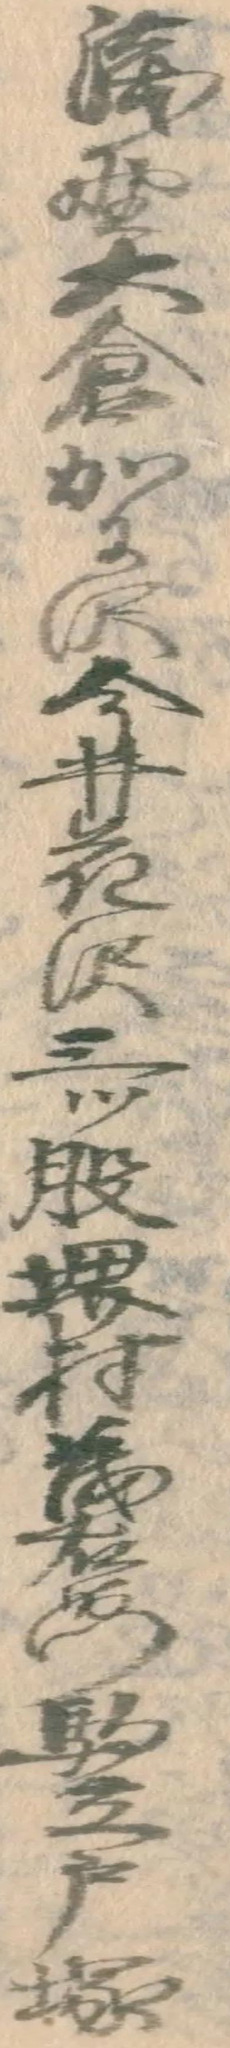浅野大倉かに沢今井花沢三ツ又堺村義右衛門駒立戸塚
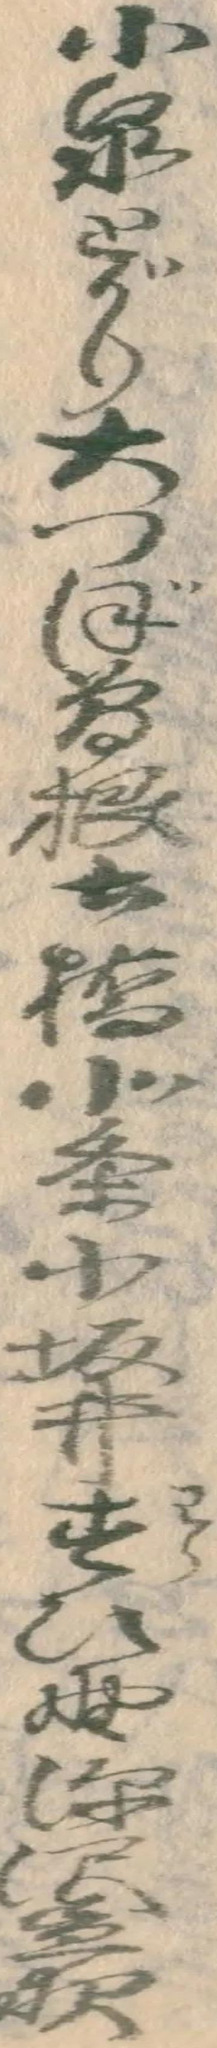小泉とがり大つぼ曽根土橋北条小坂井わらひ野沢昼夜
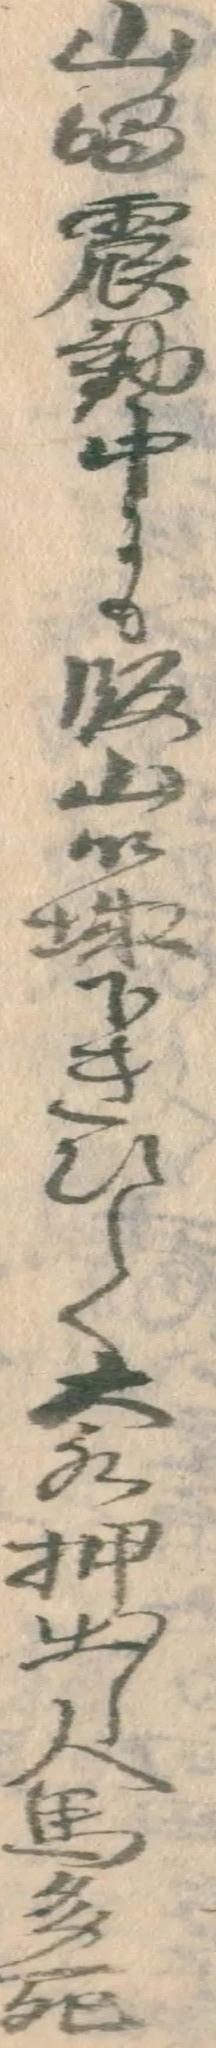山鳴震動中にも飯山御城下きびしく大水押出し人馬多死
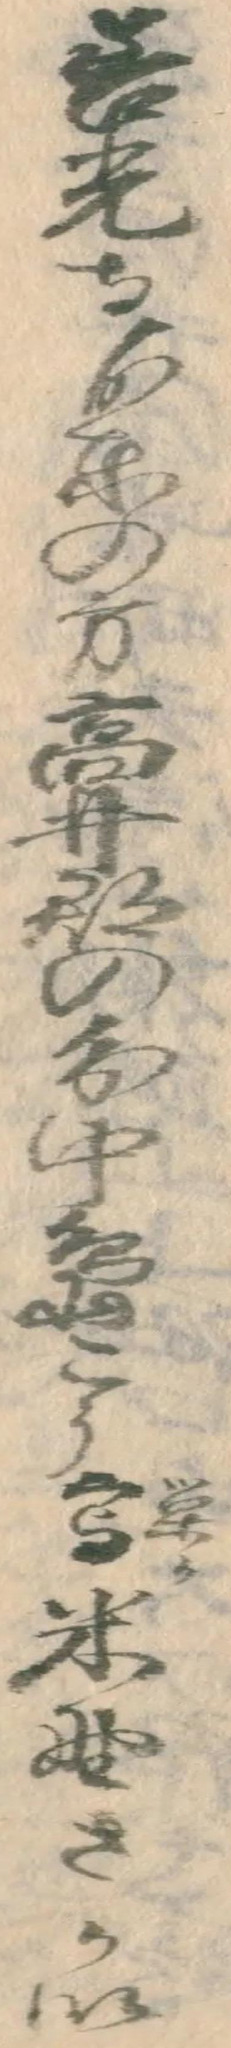善光寺ゟ東の方髙井郡の分中島こう巣か米野さかい
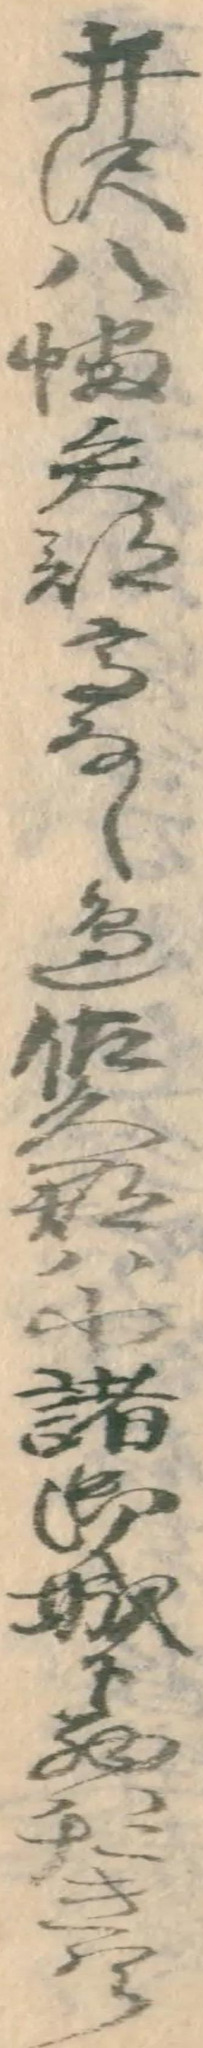井沢八幡矢部高なし辺佐久郡ハ小諸御城下西ハたきハら

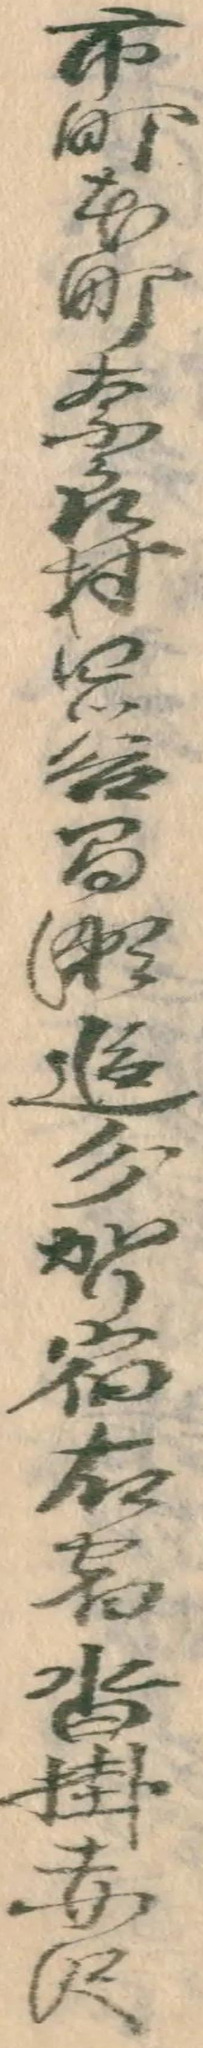市町本町奈良村四ッ谷間瀬追分かり宿右宿沓掛赤沢
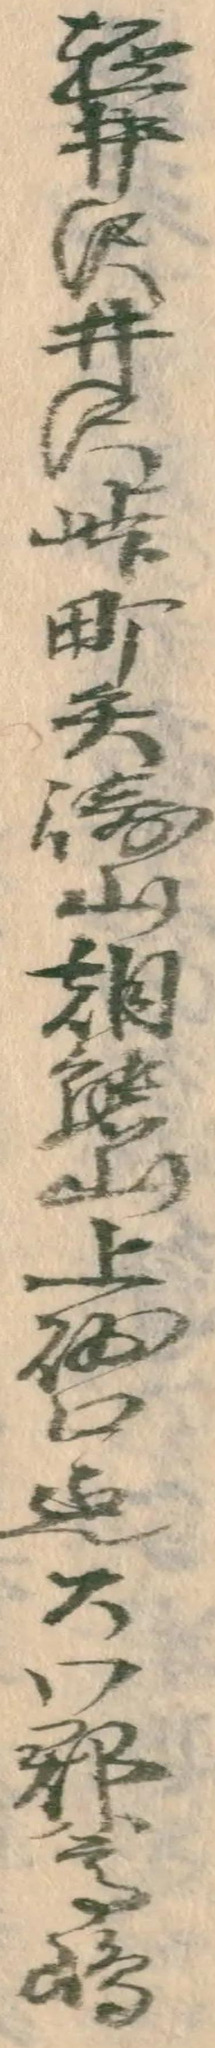軽井沢井沢峠町矢崎山朝熊山上砂口辺スワ郡ハ高嶋
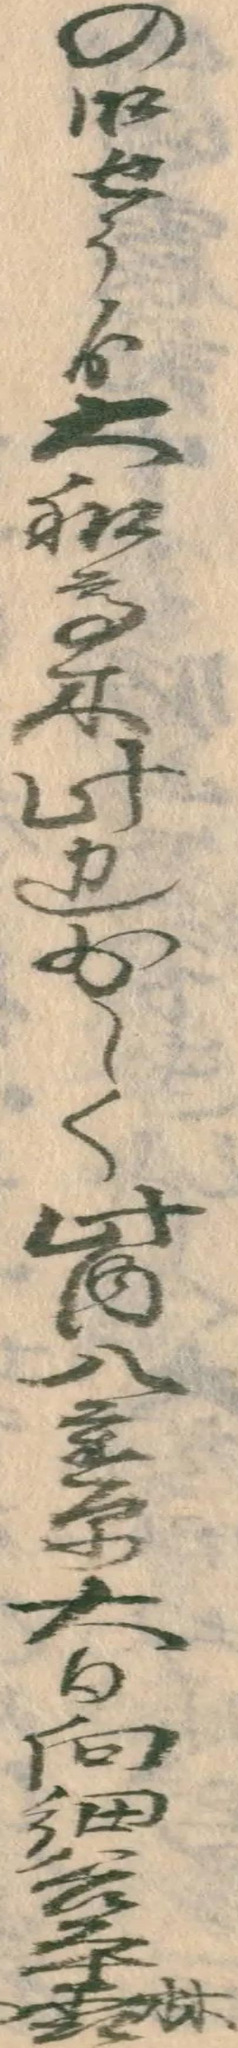の御せうゟ大和高木此辺少しく此内八重原大日向細谷原林
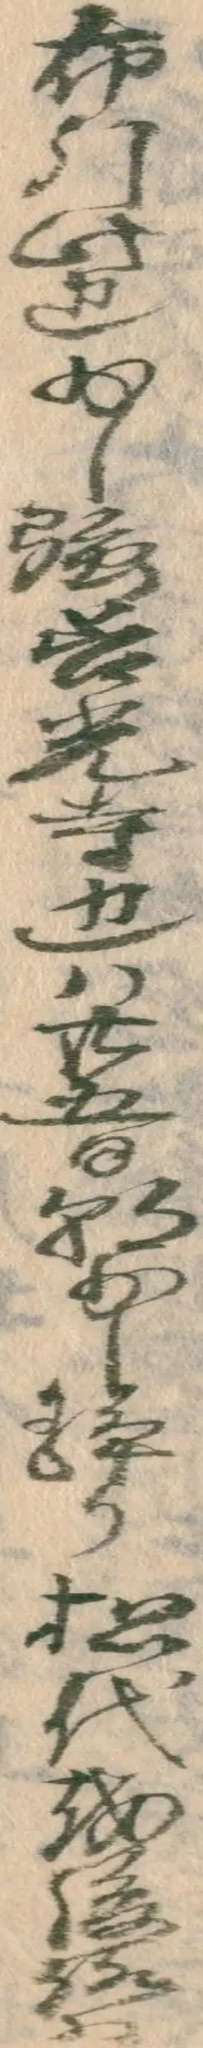布引此辺少し強善光寺辺ハ廿五日朝少し静り松代越後終日
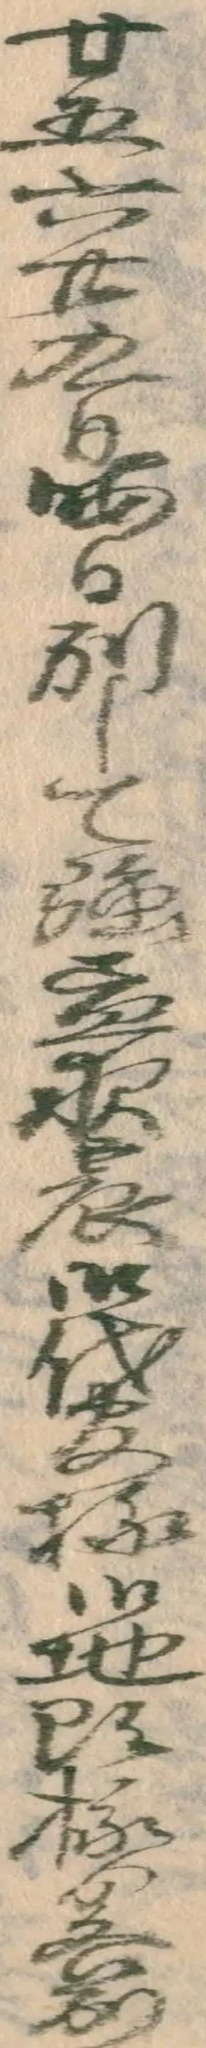廿五六廿九日晦日別して強昼夜震御代官様御地頭ゟ格別
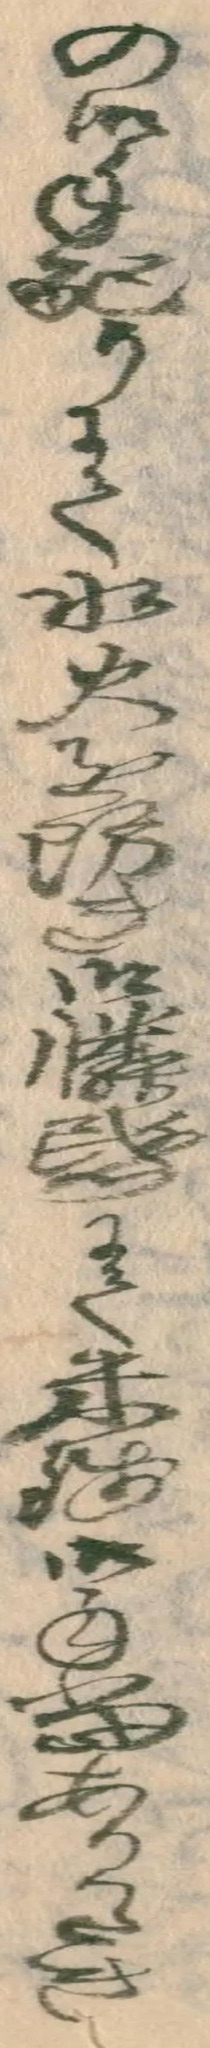の御手配りにて水火を防き御憐愍にて米銭御手当ありかたき
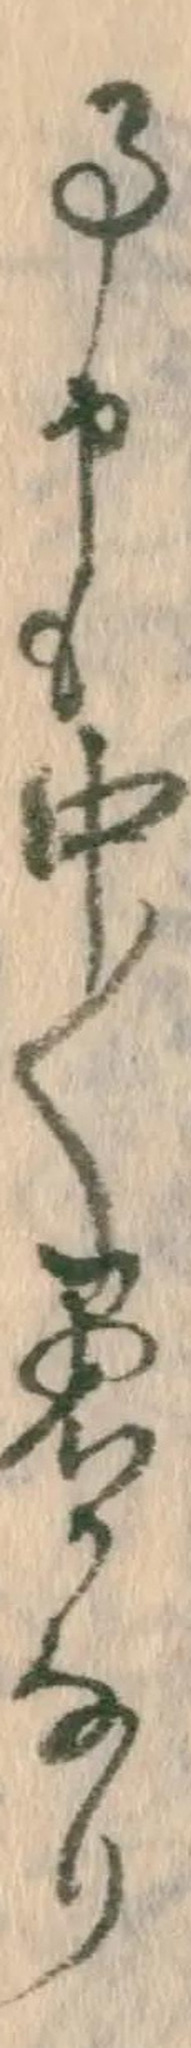事申も中々安心なり
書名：信州大地震之記
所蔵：国立国会図書館 National Diet Library, JAPAN
